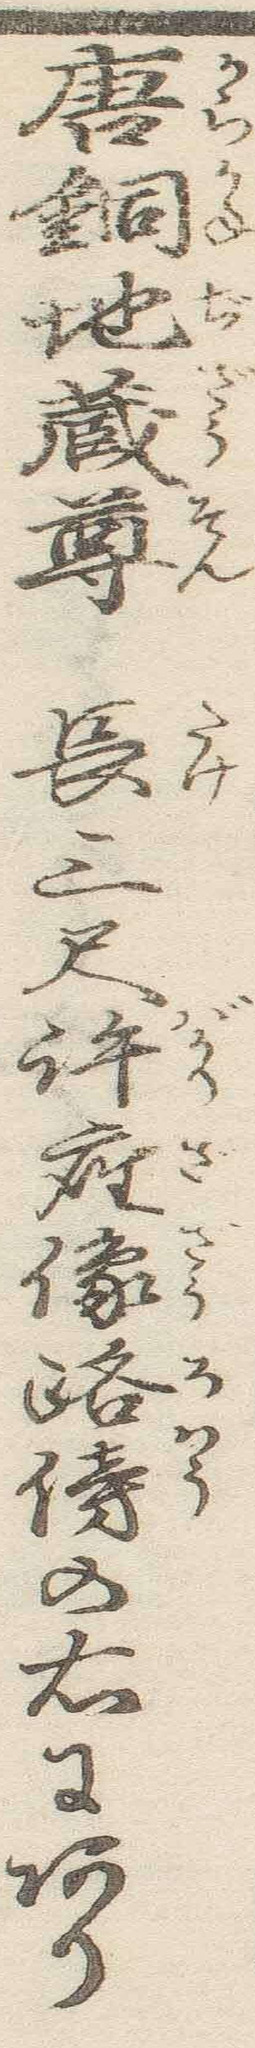唐銅地蔵尊長三尺許座像路傍の右にあり
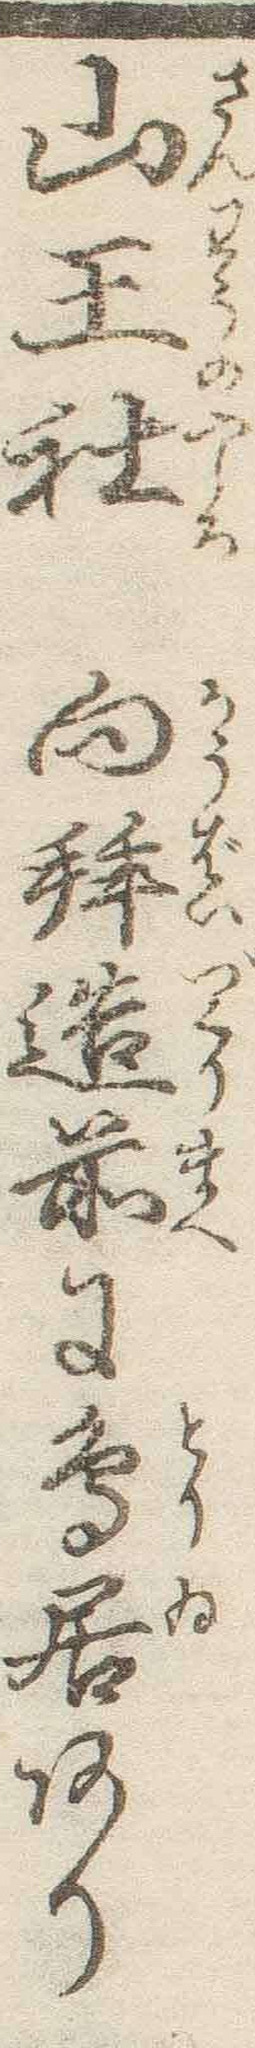山王社向拜造前に鳥居あり
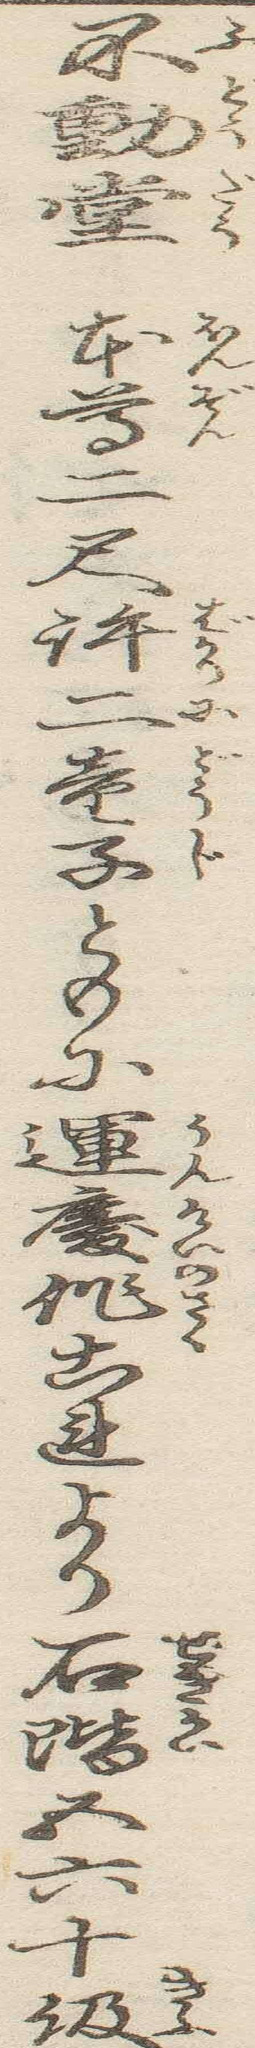不動堂本尊二尺許二童子ともに運慶作これより石階五六十級
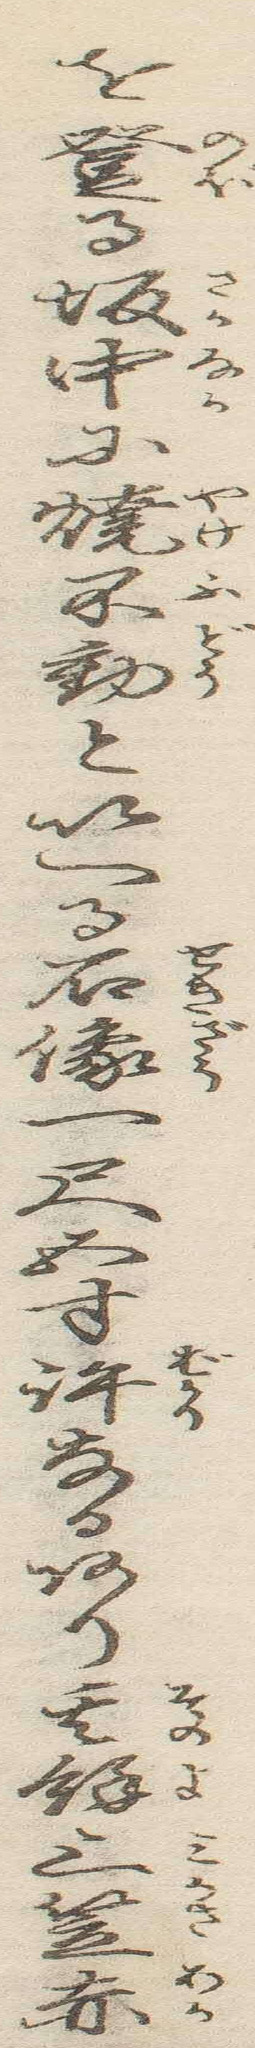を登る坂中に燒不動といへる石像一尺五寸許なるあり其餘三笠赤
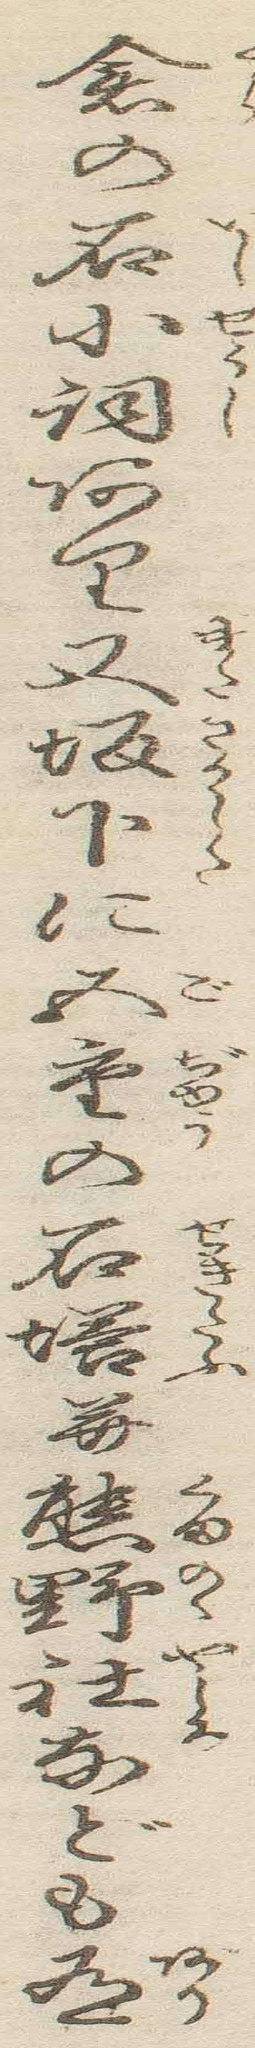倉の石小祠あり又坂下に五重の石塔并熊野社なども有
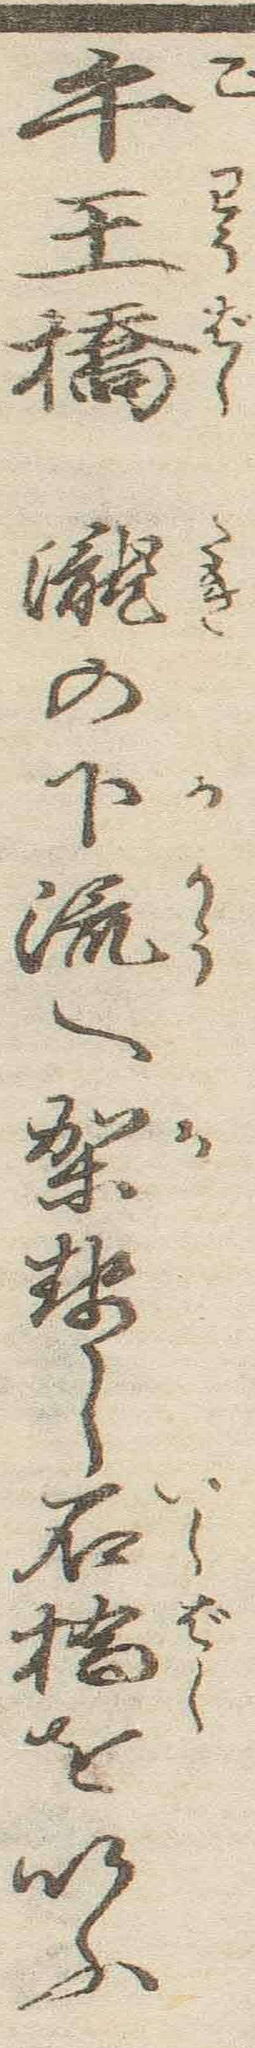牛王橋瀧の下流へ架せし石橋をいふ

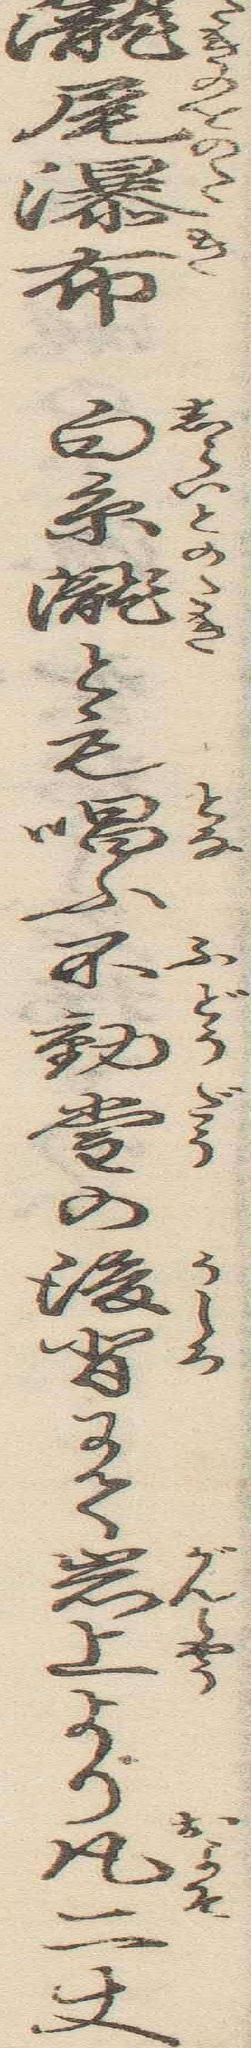瀧尾瀑布白糸瀧とも唱ふ不動堂の後背にて岩上より凡二丈
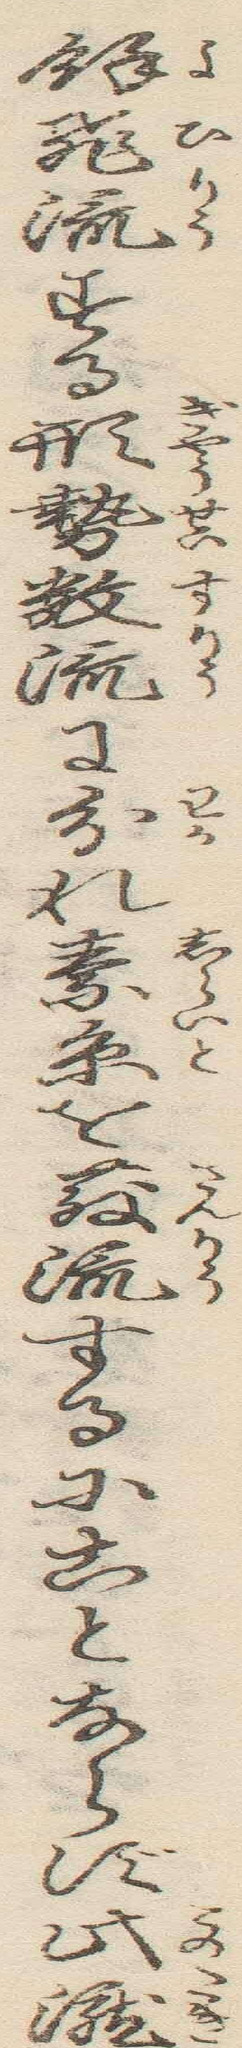餘飛流する形勢数流に分れ素糸を散流するにことならず此瀧
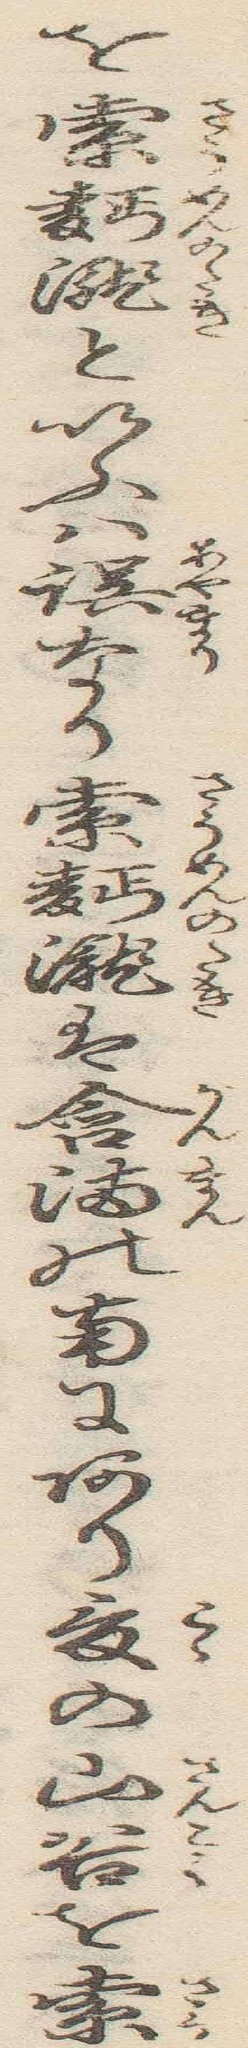を索麪瀧といふは誤なり索麪瀧は含満の南にあり爰の山谷を素
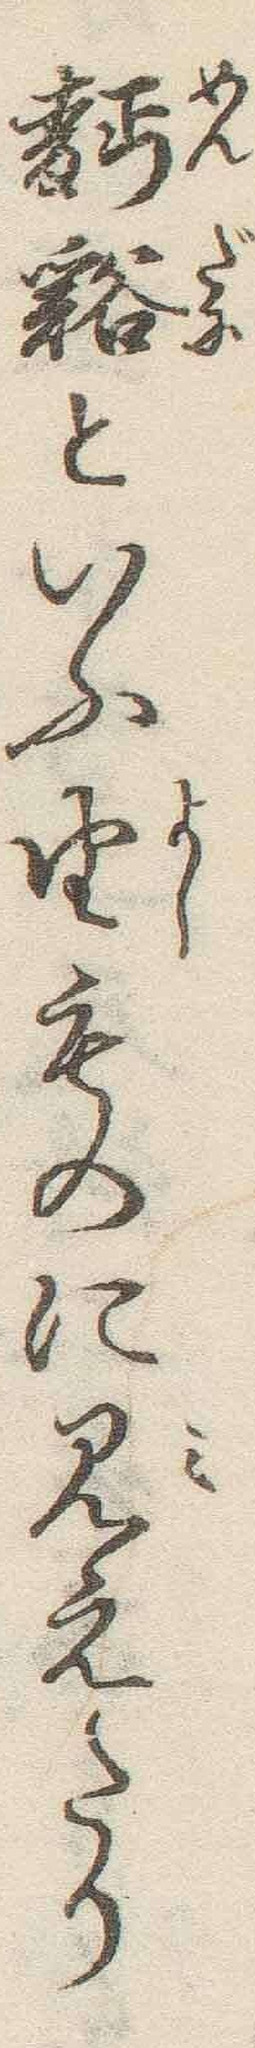麪谿といふ由ものに見えたり
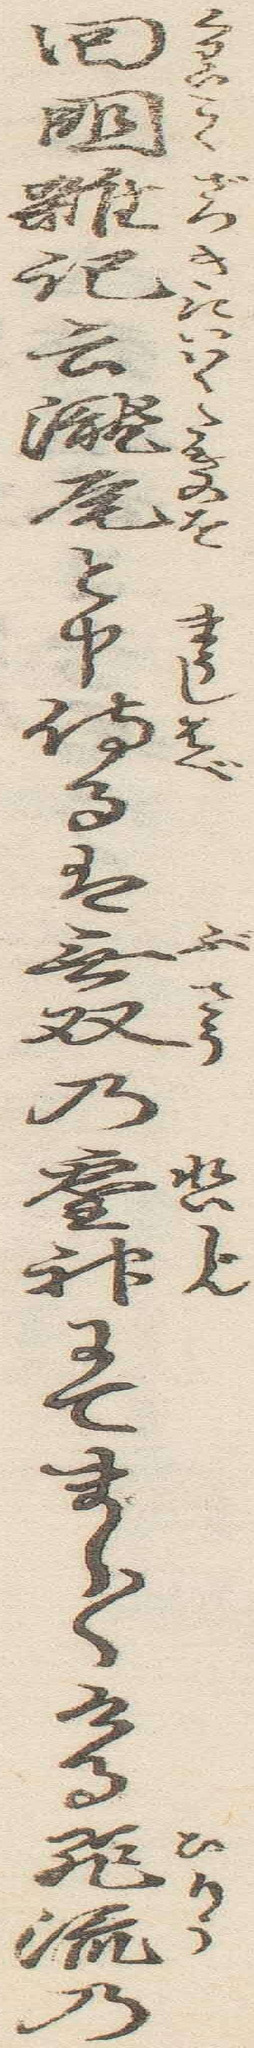囘國雑記云瀧尾と申侍るは無双の靈神にてまし〳〵ける飛流の
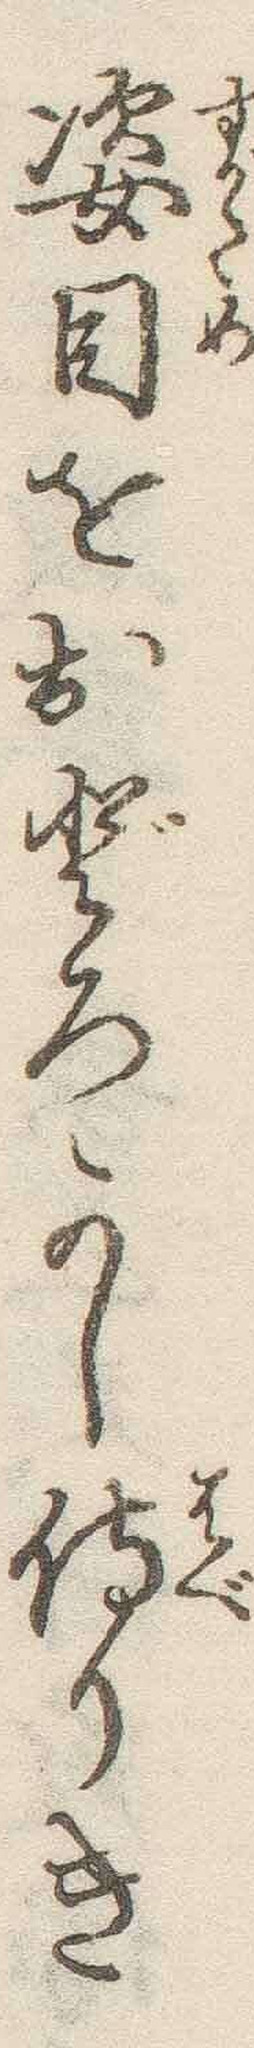姿目をおどろかし侍りき
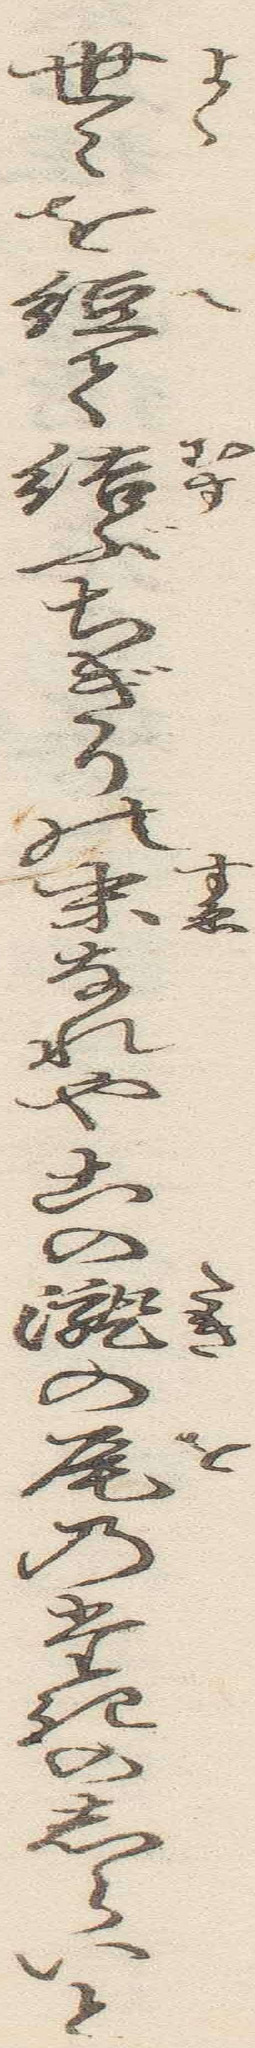世〻を經て結ぶちぎりの末なれやこの瀧の尾のたきのしらいと
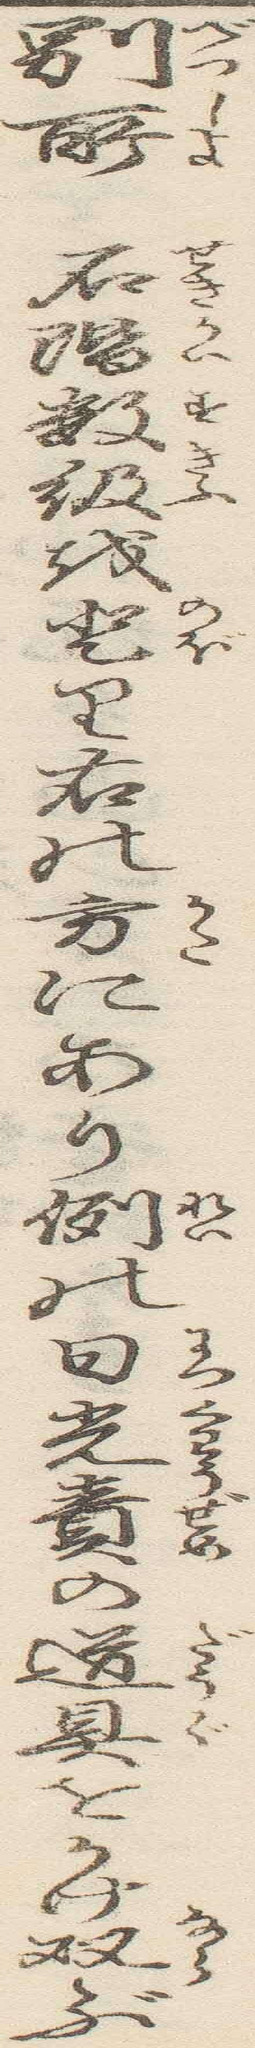別所石階数級を登り右の方にあり例の日光責の道具をかけ双ぶ
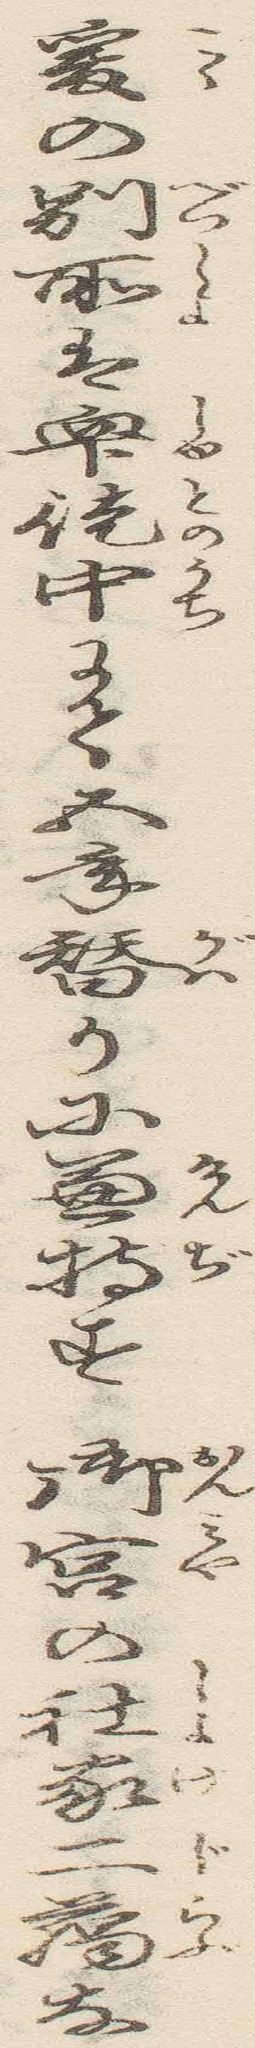爰の別所は衆徒中にて五年替りに兼持す御宮の社家二﨟な
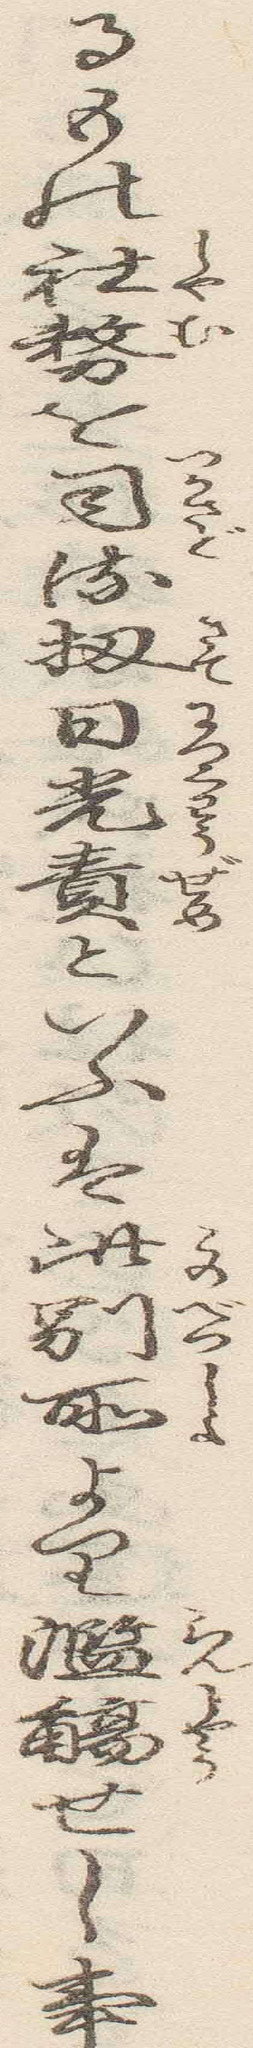るもの社務を司る扨日光責といふは此別所より濫觴せし事
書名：日光山志
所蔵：東京学芸大学附属図書館 国文学研究資料館
